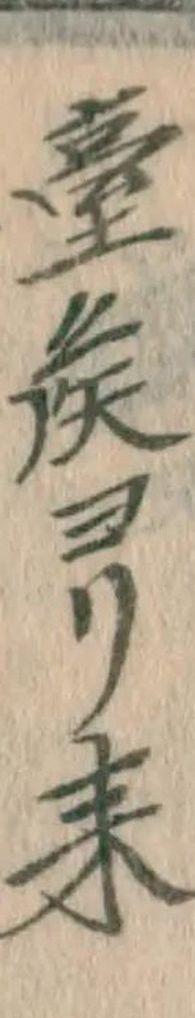臺矦ヨリ来
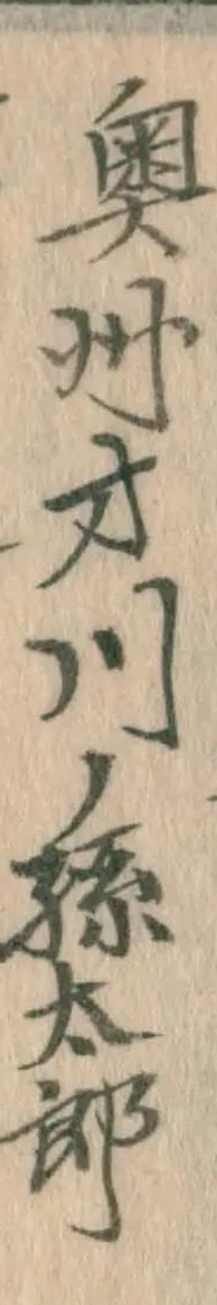奥州才川ノ孫太郎
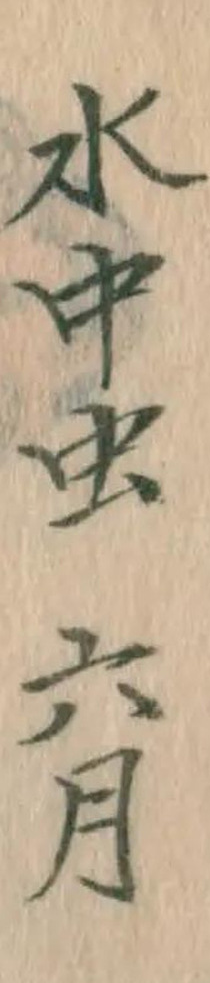水中虫六月
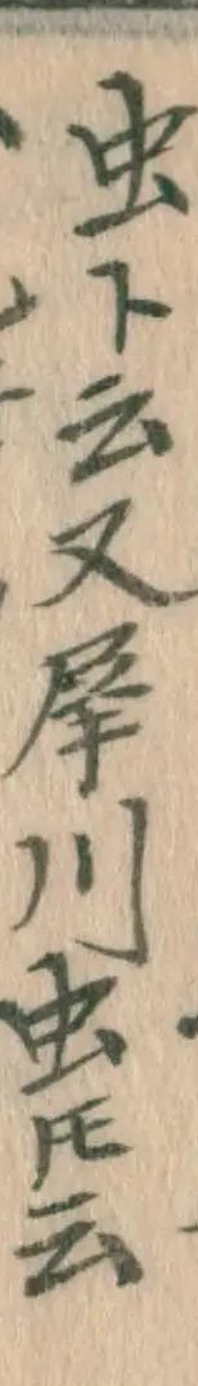虫ト云又犀川虫トモ云
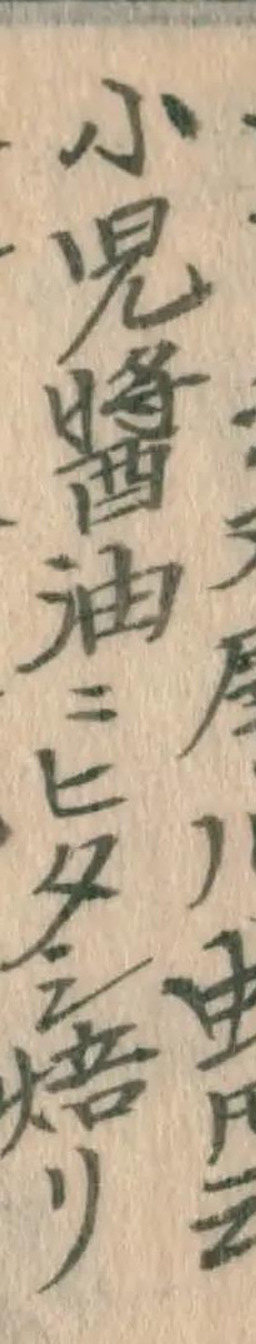小児醤油ニヒタシ焙リ
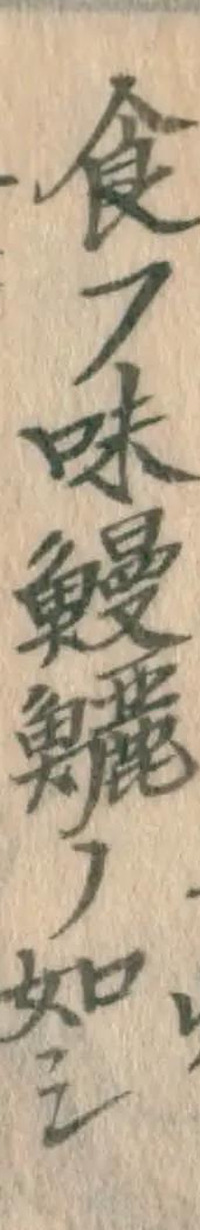食フ味鰻鱺ノ如シ
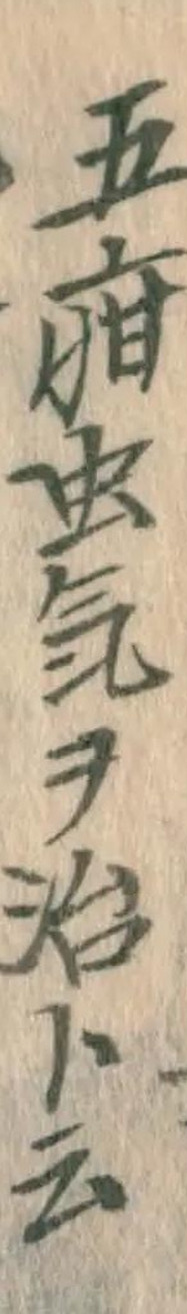五疳虫気ヲ治ト云
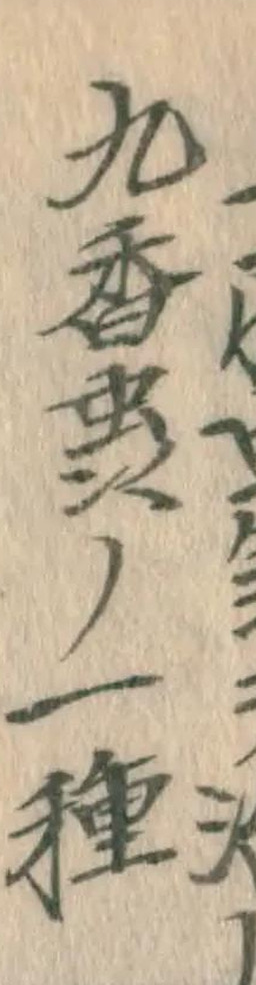九香蟲ノ一種
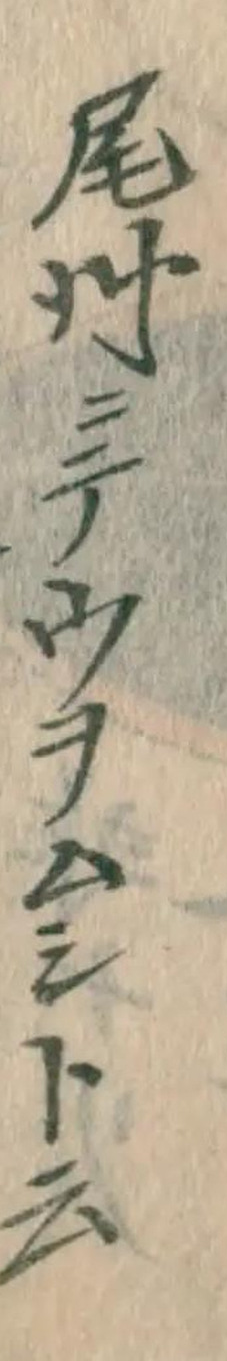尾州ニテウヲムシト云
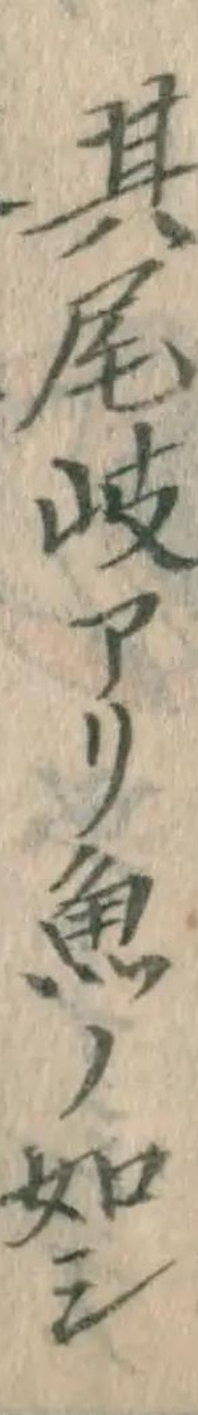其尾岐アリ魚ノ如シ
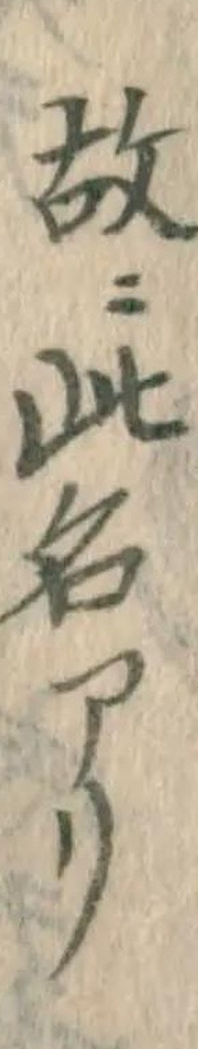故ニ此名アリ

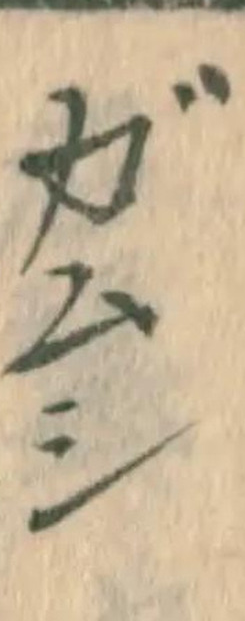ガムシ
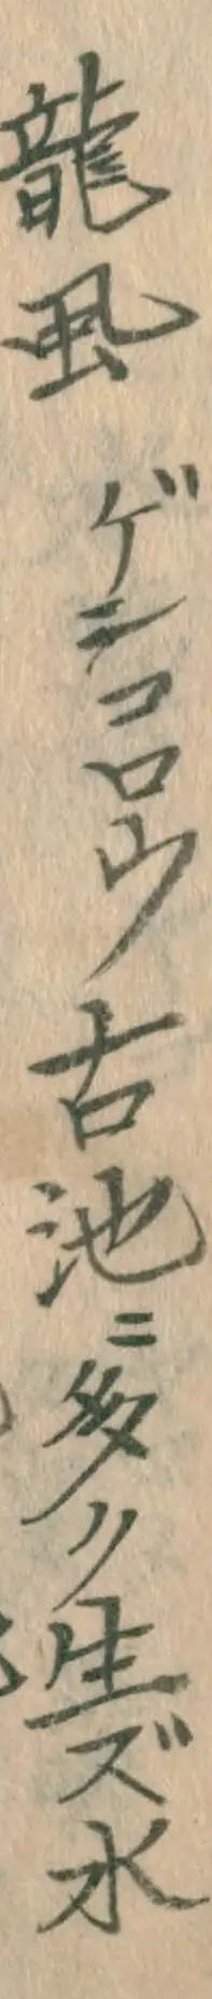龍虱ゲンコロウ古池ニ多ク生ズ水
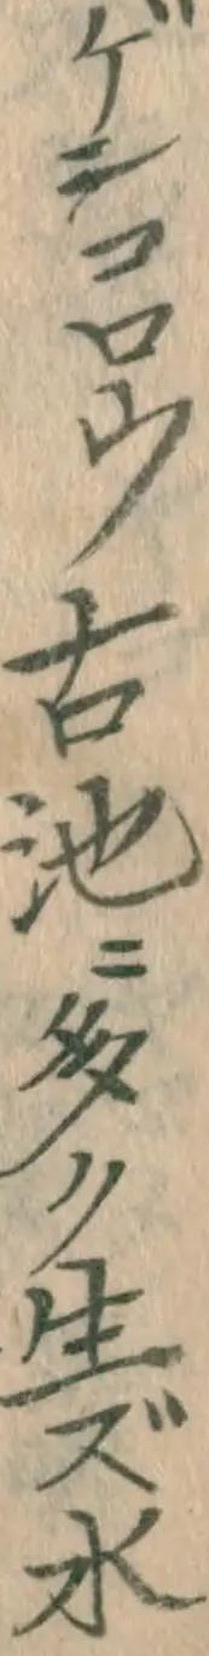龍虱ゲンコロウ古池ニ多ク生ズ水
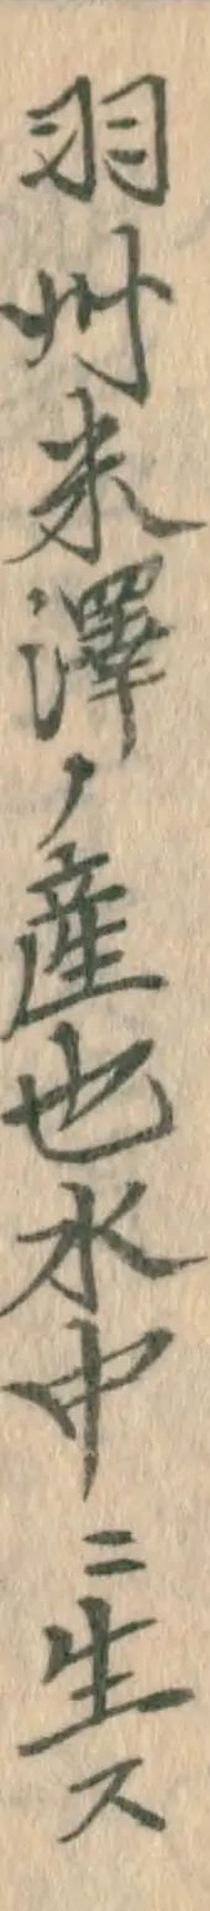羽州米澤ノ産也水中ニ生ス
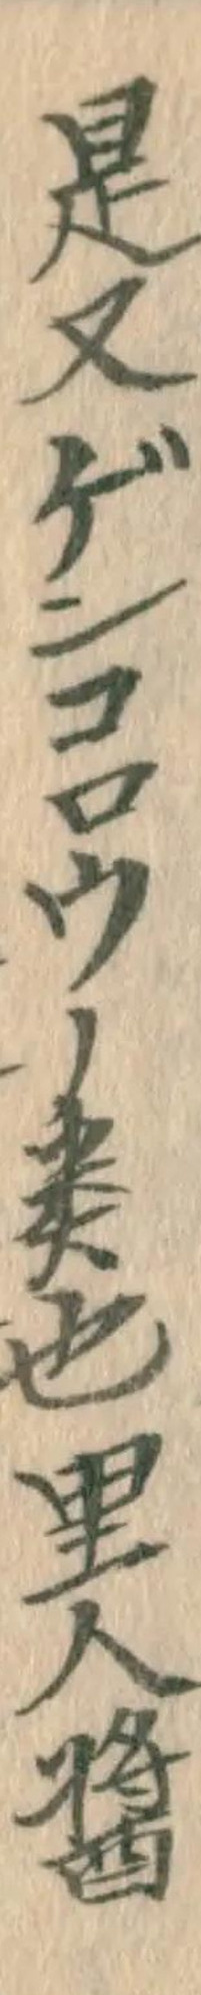是又ゲンコロウノ类也里人醤
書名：千蟲譜 3巻. [2]
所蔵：国立国会図書館 National Diet Library, JAPAN
